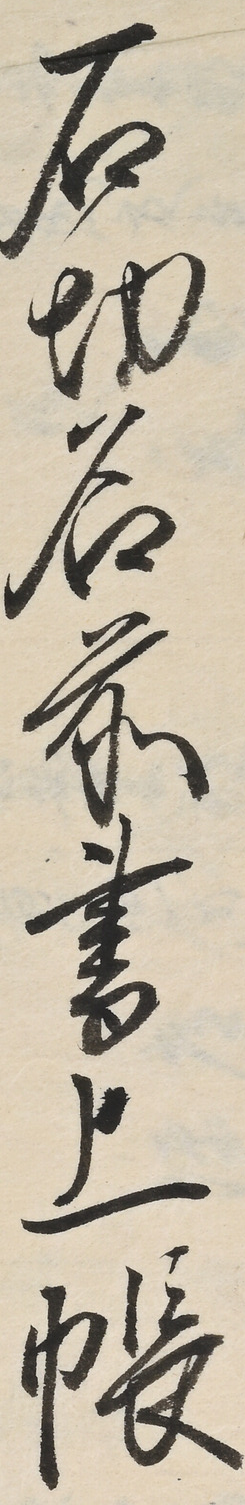石切名前書上帳
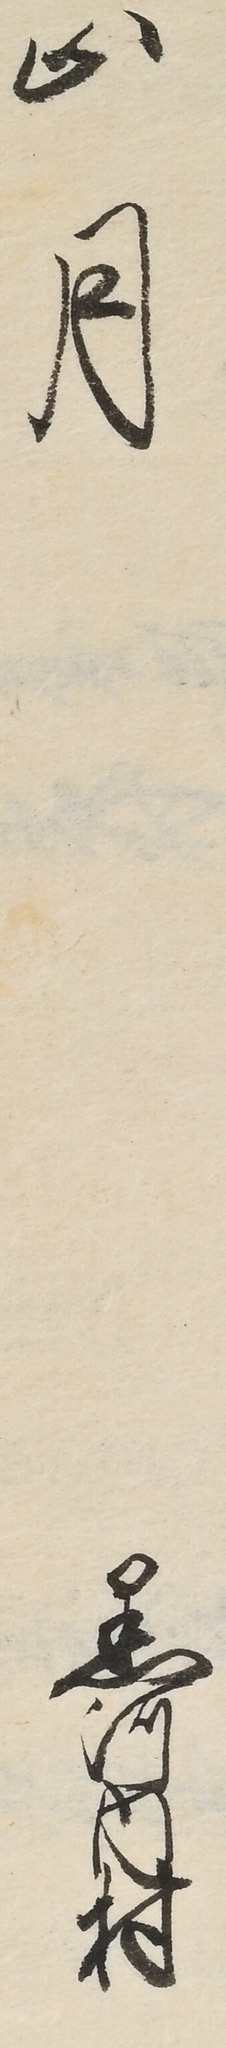正月黒河内村

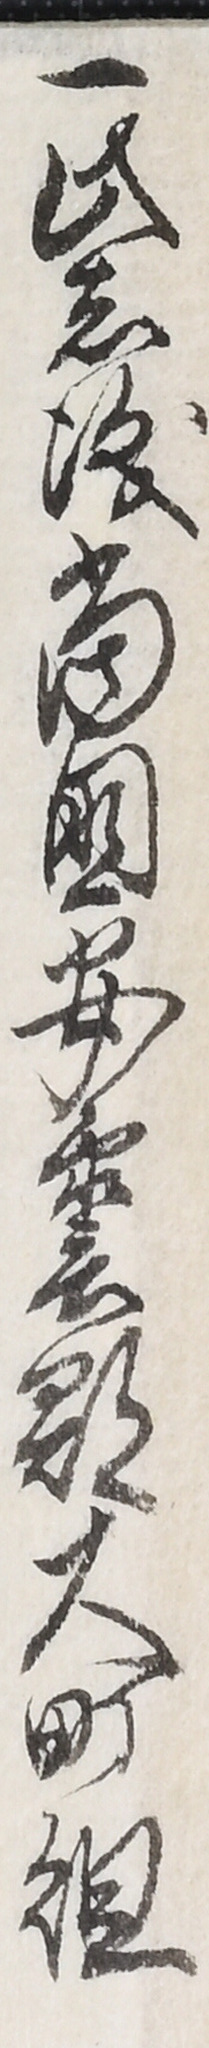一此者儀当国安曇郡大町組
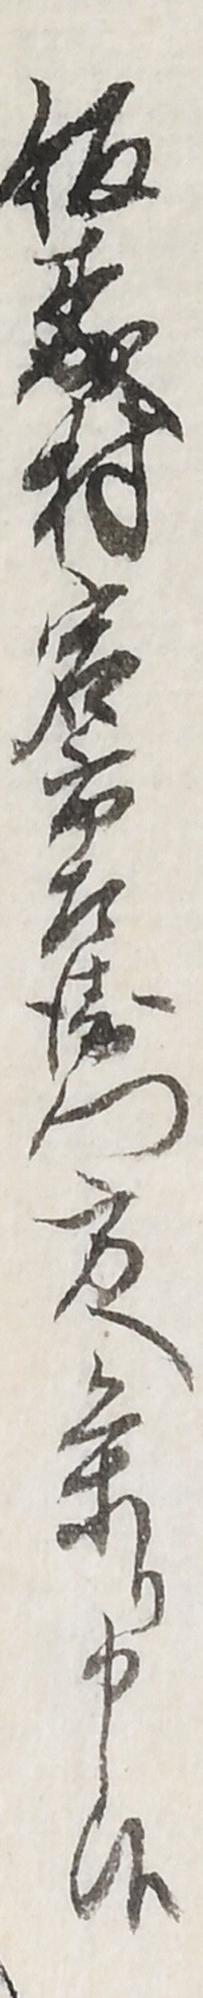飯森村宿市左衛門方へ参り申候
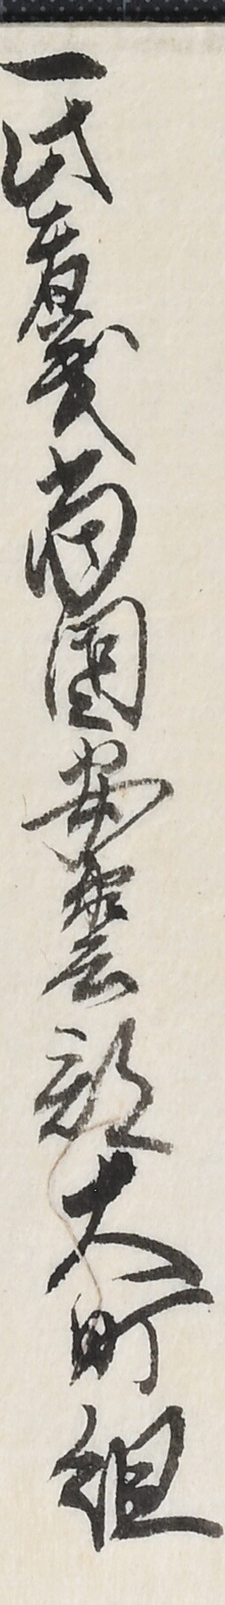一此者義当国安曇郡大町組
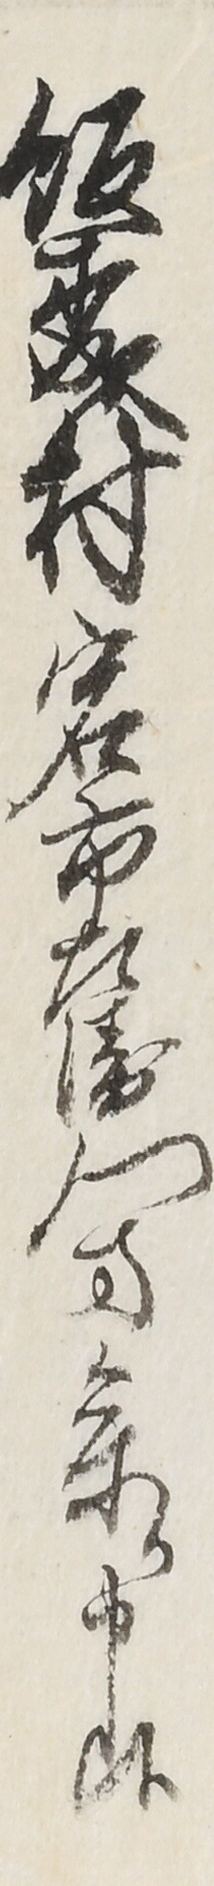飯森村宿市左衛門方参り申候
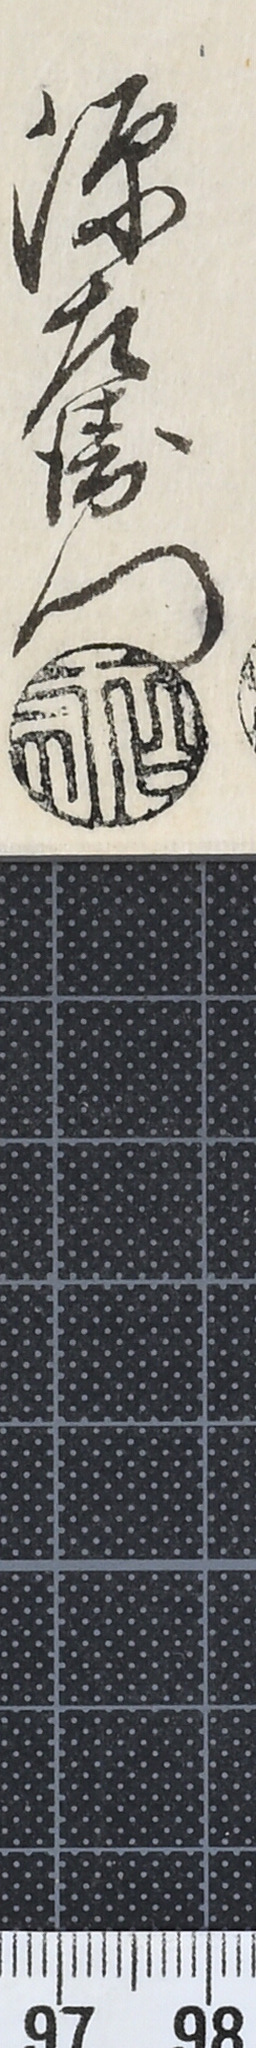源左衛門(印)
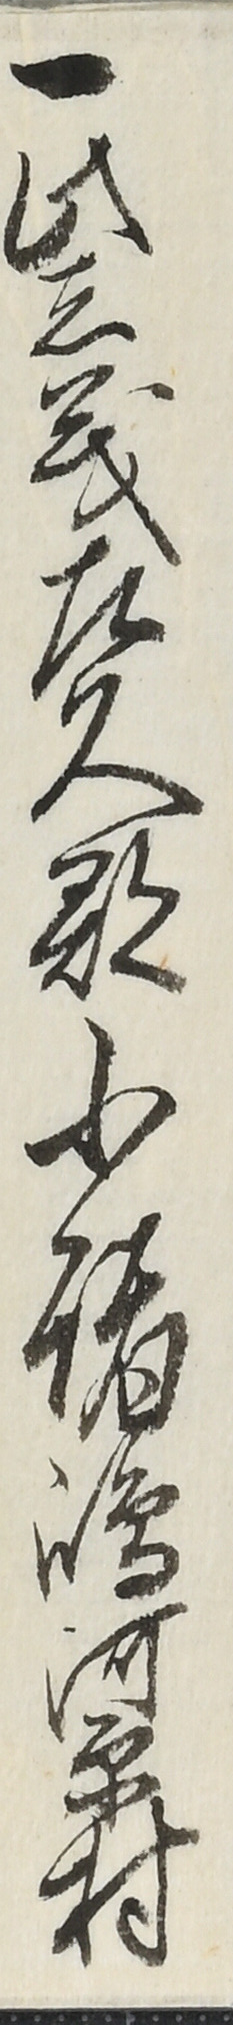一此者義佐久郡小諸嶋河原村
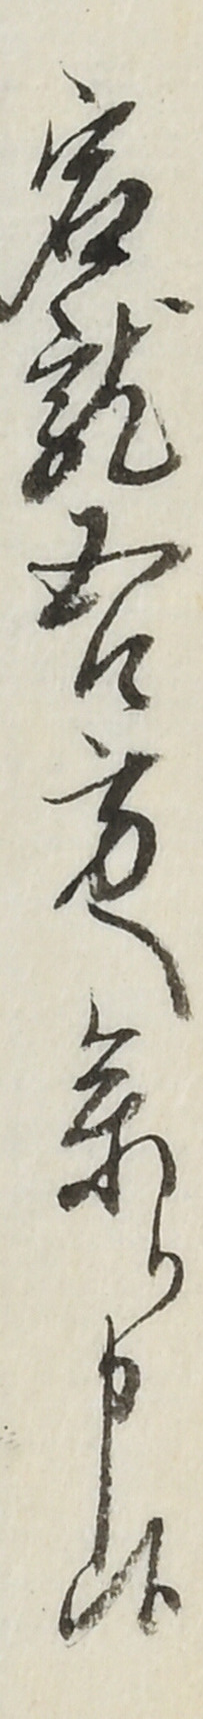宿龍五郎方へ参り申候

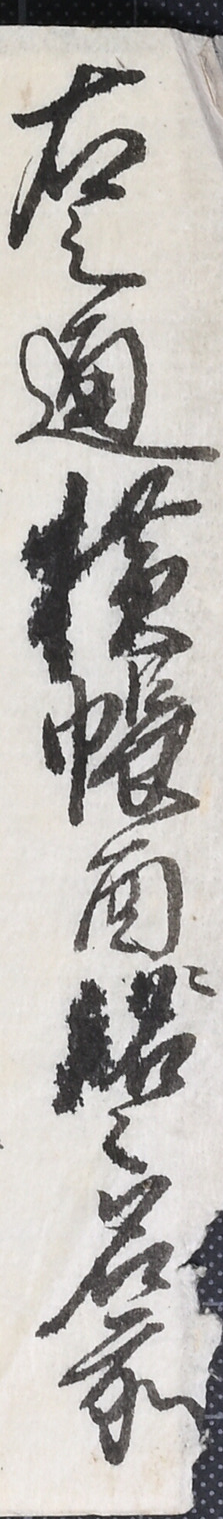右之通横帳面銘々名前
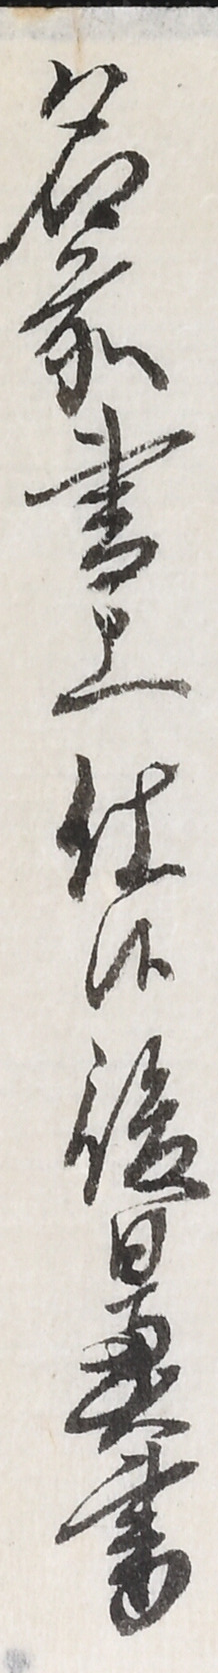名前書上仕候後日奥書
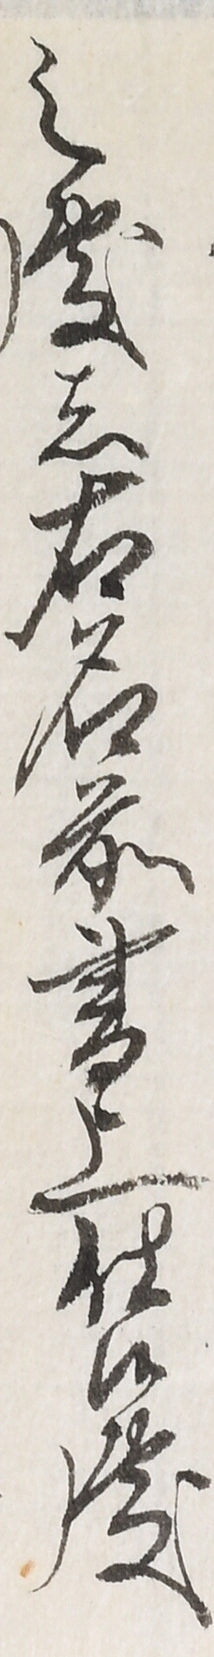之處者右名前書上仕候處
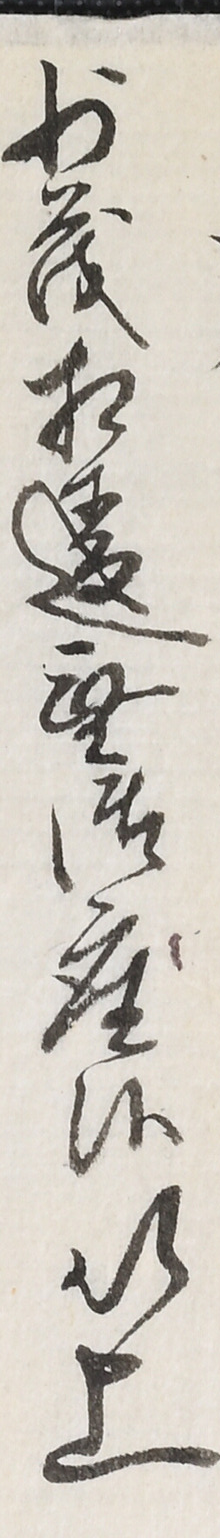少茂相違無御座候以上
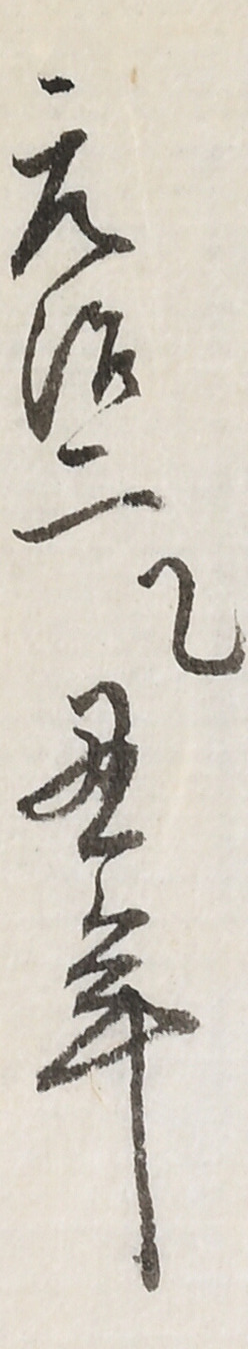元治二乙丑年
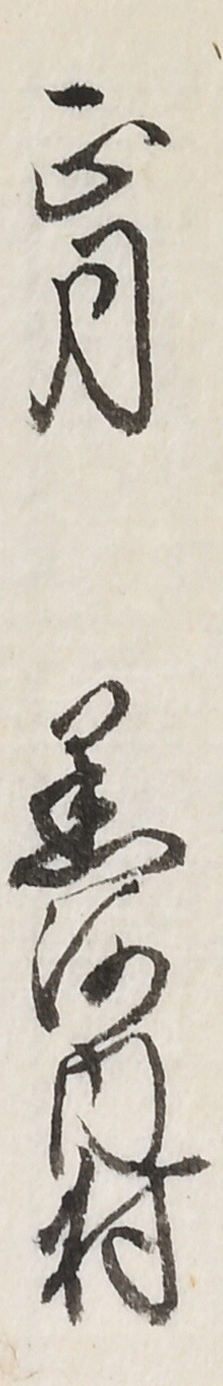正月黒河内村
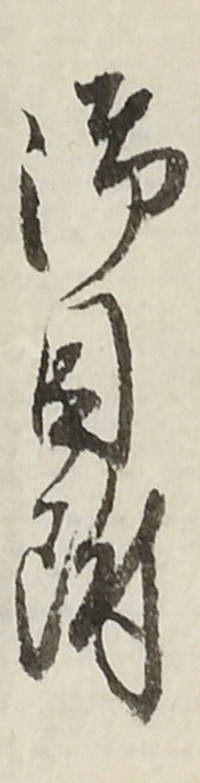御目附
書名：元治二乙丑年正月石切名前書上帳
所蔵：伊那市立高遠町図書館・合同会社AMANE
